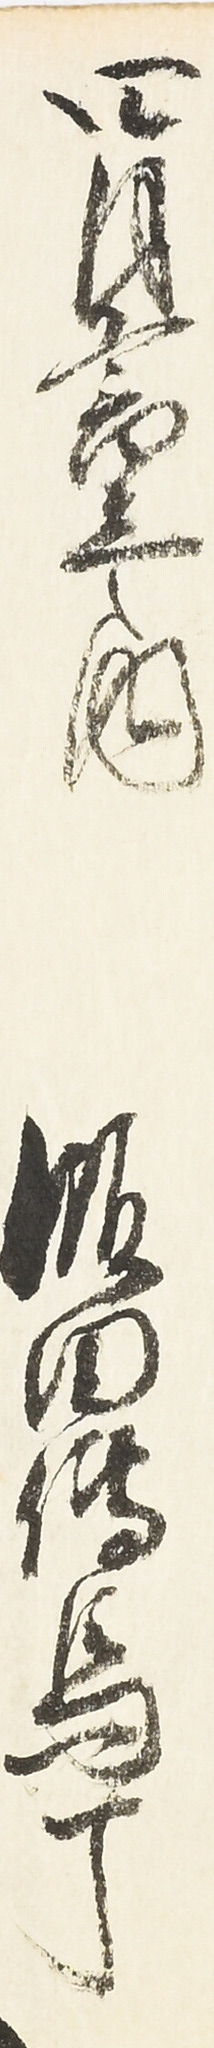四月書上之内飯田伝馬丁
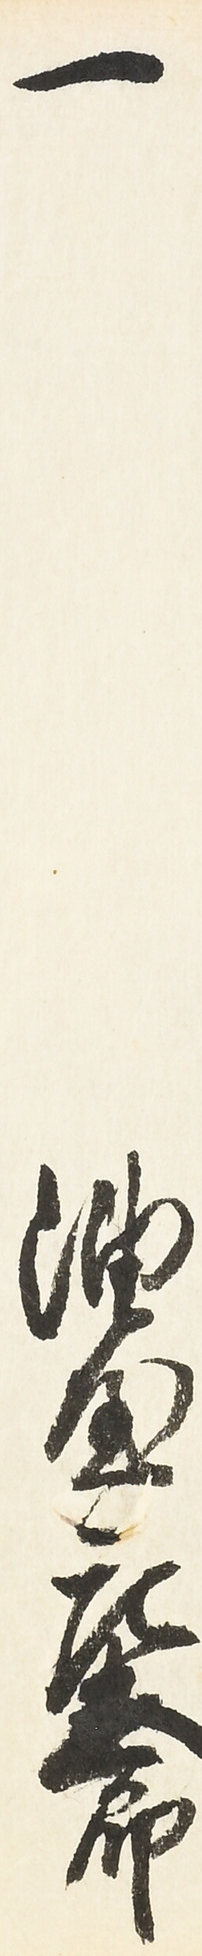一油屋庄太郎
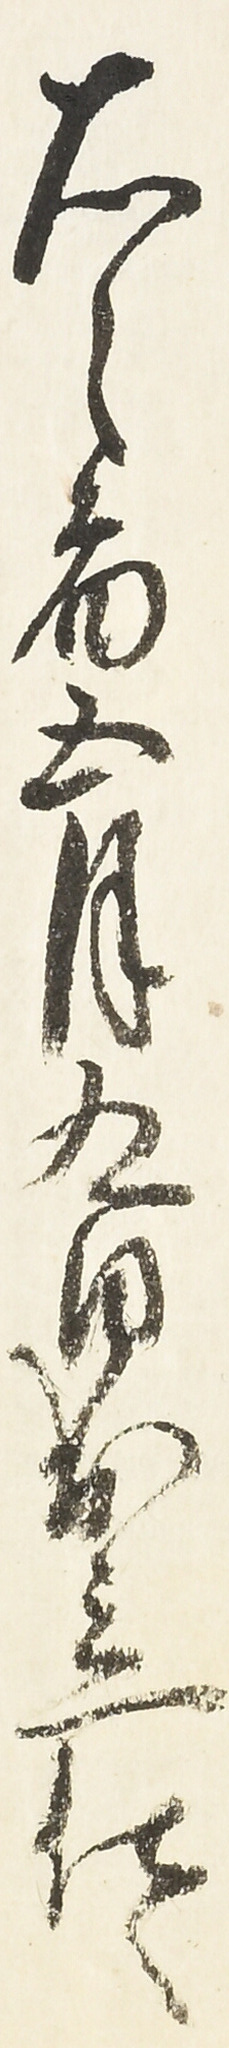右之者五月九日出立仕候
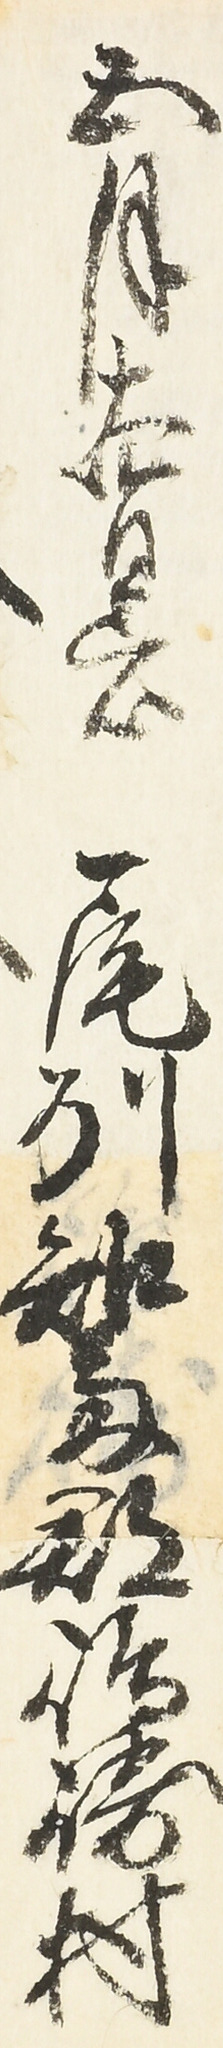五月十四日着尾州知多郡嶋崎村
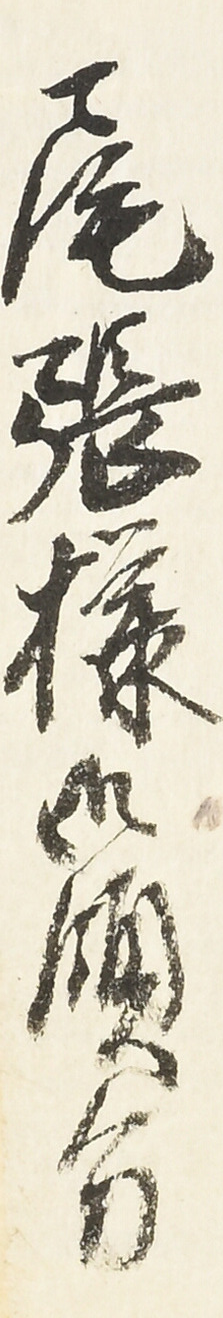尾張様御領分
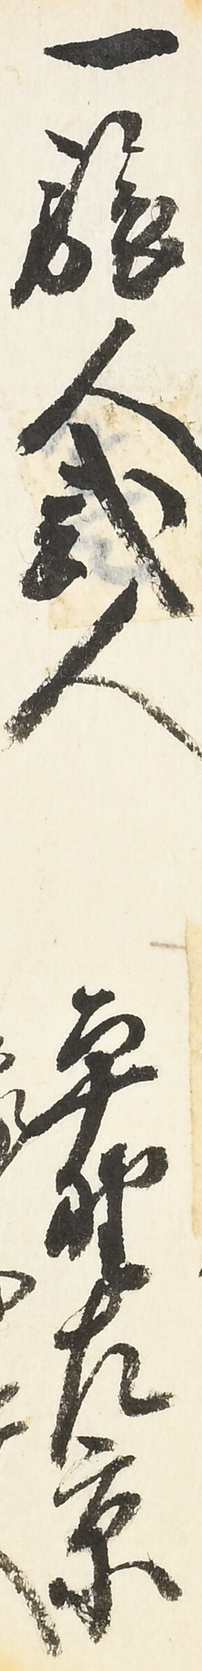一旅人弐人平野左京
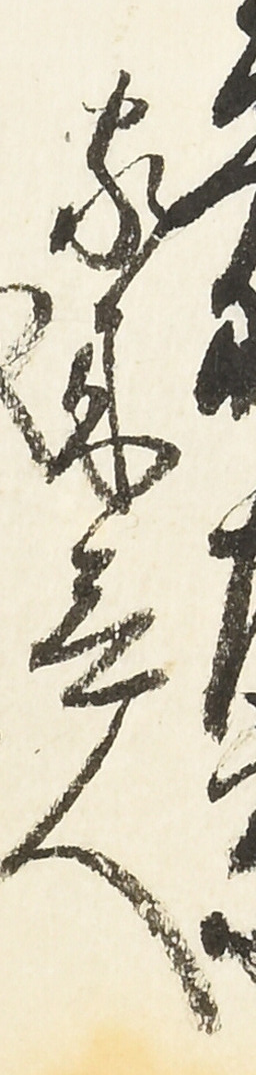家来壱人
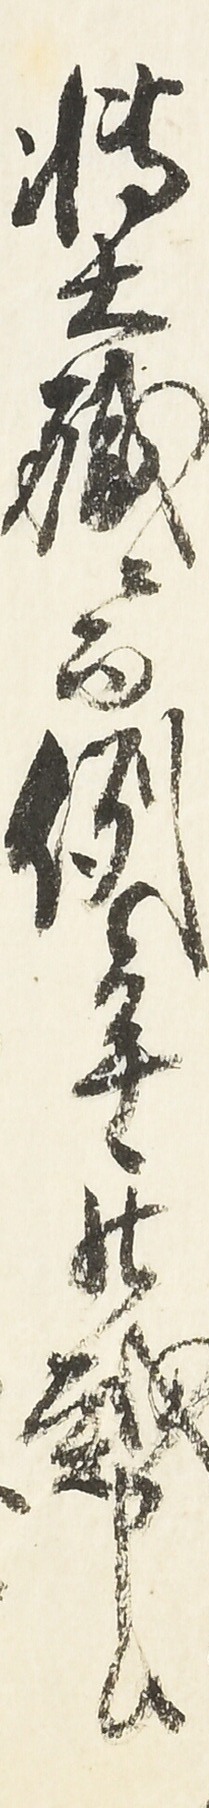転士職ニ而例年罷越申候
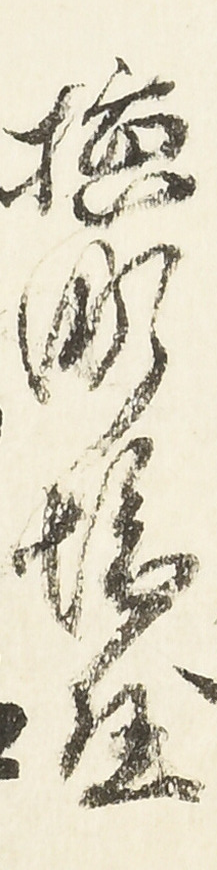横町塩屋
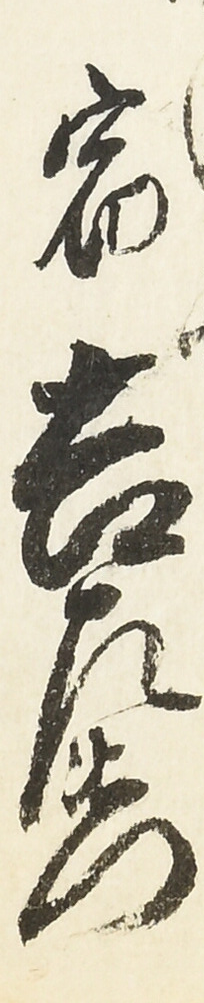宿吉左衛門
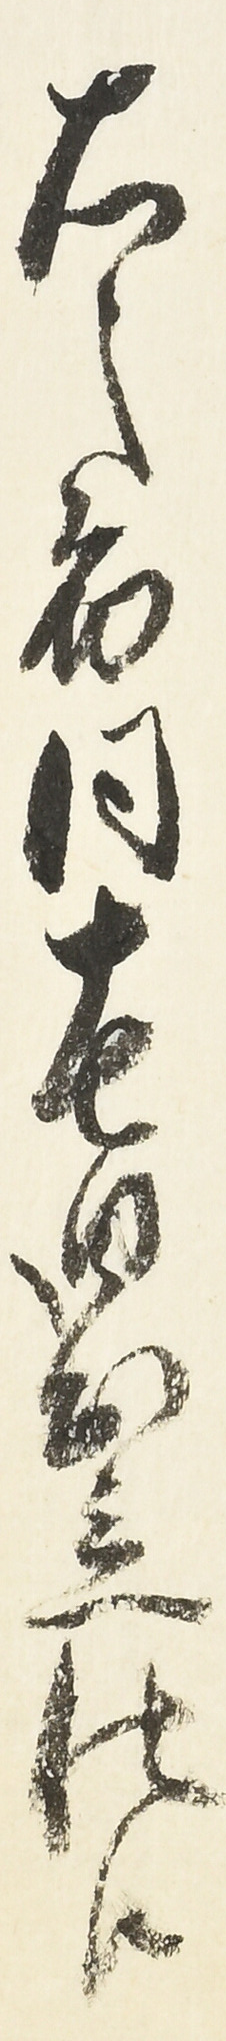右之者同廿一日出立仕候
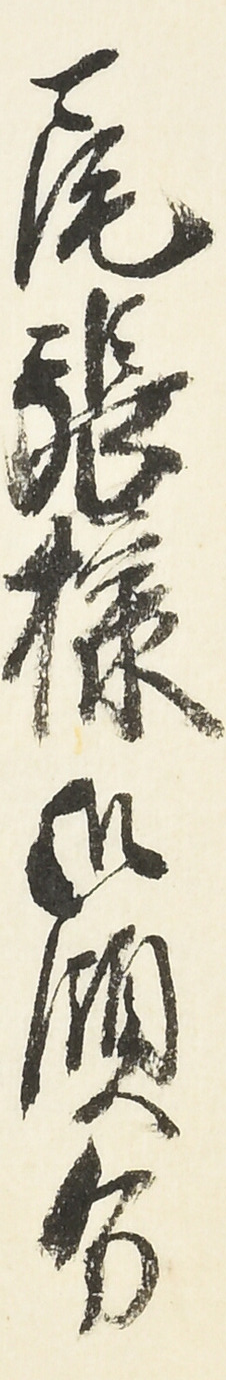尾張様御領分
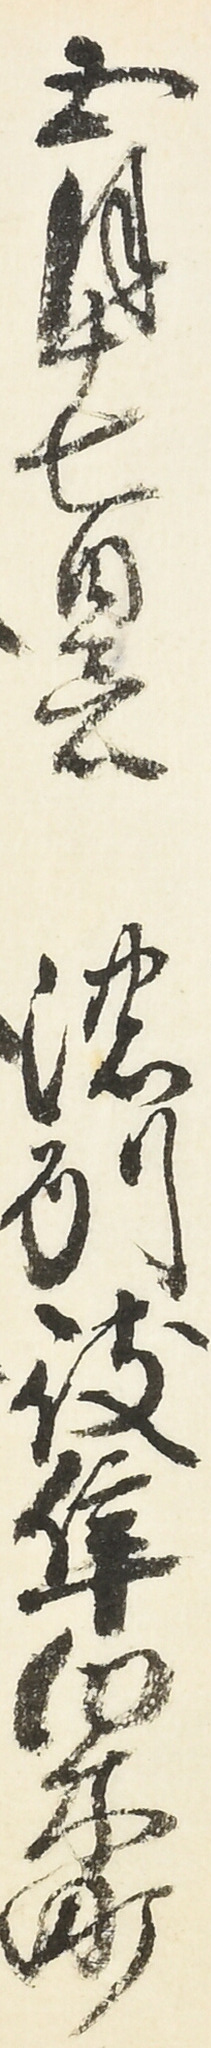五月十七日着濃州岐隼白木町
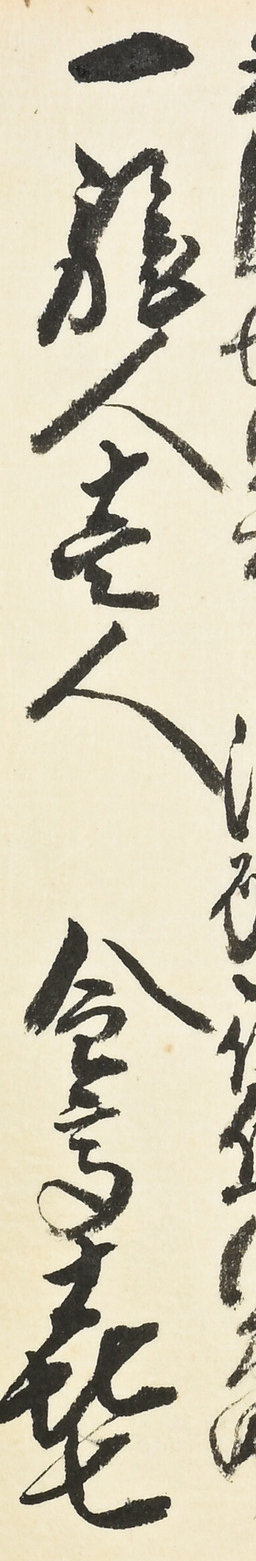一旅人壱人金高喜七
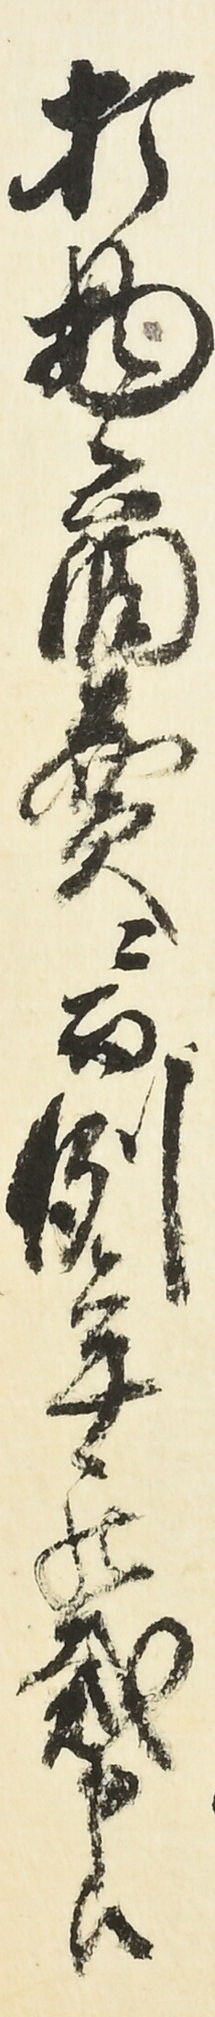打物商売ニ而例年罷越申候
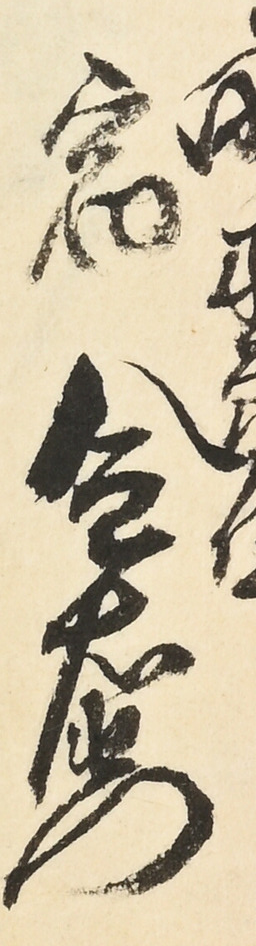宿吉左衛門
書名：町中旅人泊控帳
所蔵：伊那市立高遠町図書館・合同会社AMANE
